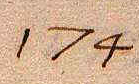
174
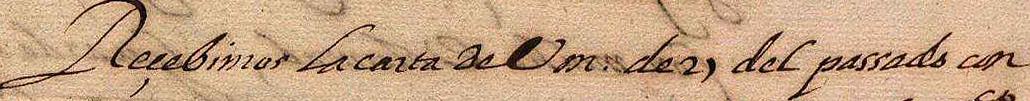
Recebimos la carta de Vm. de 27 del passado con
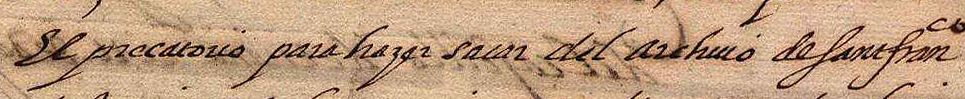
El precatorio para hazer sacar del archiuo de sant franco
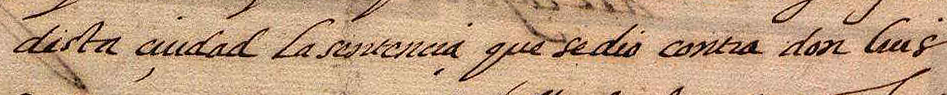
desta ciudad la sentencia que se dio contra don luis
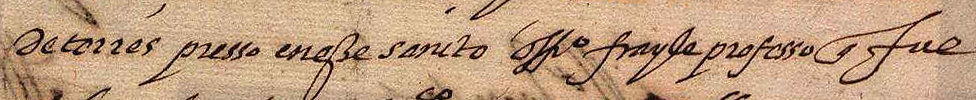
de torres presso en esse sancto offo frayle professo q̄ fue
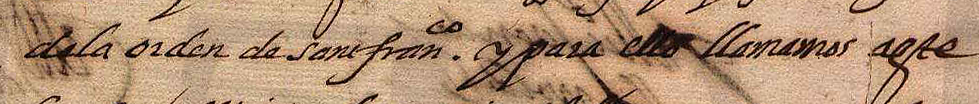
de la orden de sant franco. y para ello llamamos a este
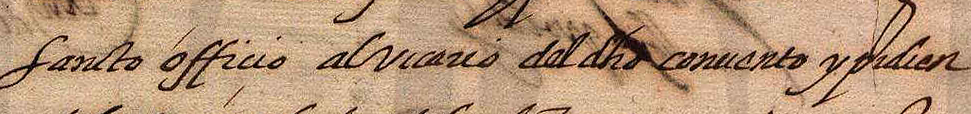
sancto officio al vicario del dho conuento, y pidien
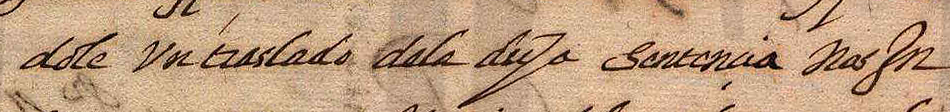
dole vn traslado de la dicha Sentencia nos Jn
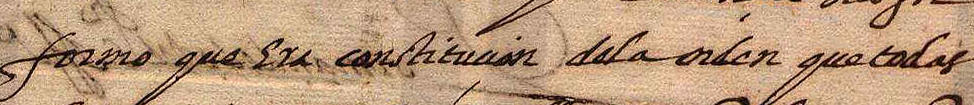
formo que Era constitucion de la orden que todas
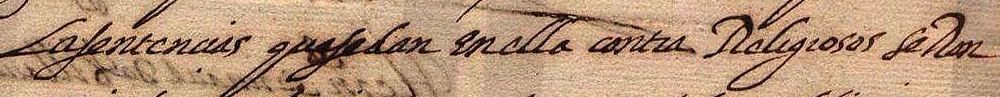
La sentencias que se dan En ella contra Religiosos se Ron
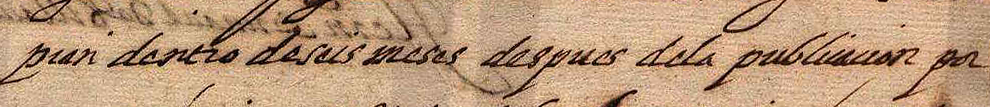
pian dentro de seis meses despues de la publicacion por
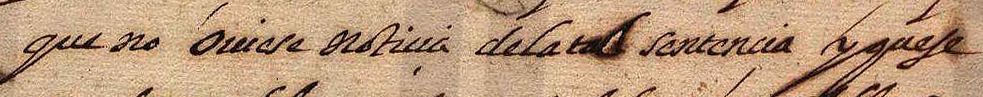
que no ouiese noticia de la tal sentencia y que se
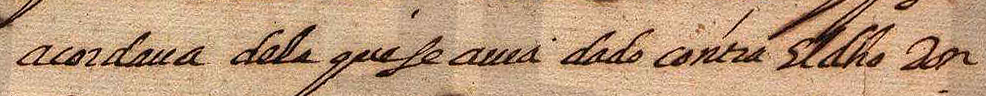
acordaua de la que se auia dado contra El dho don
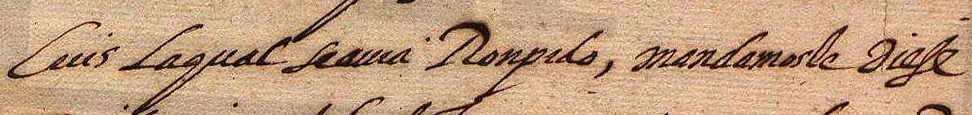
Luis la qual se auia Ronpido, mandamosle diese
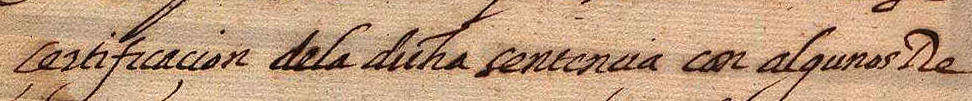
certificacion de la dicha sentencia con algunos Re
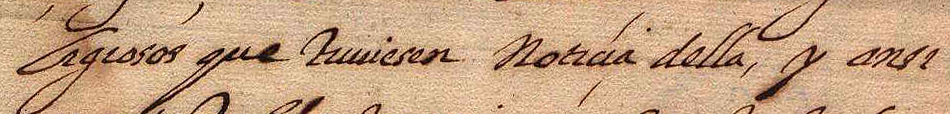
ligiosos que tuuiesen noticia della, y ansi
